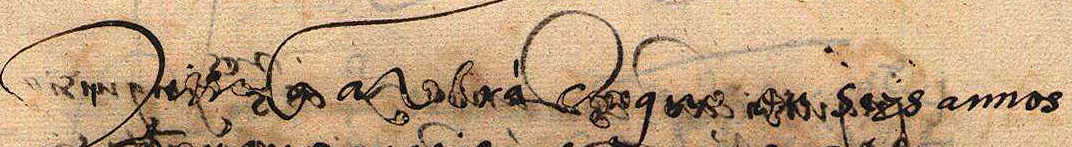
Disse q̄ averá cinquo ou seys annos
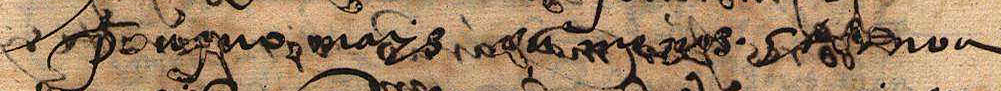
pouquo mays ou menos. E tornou
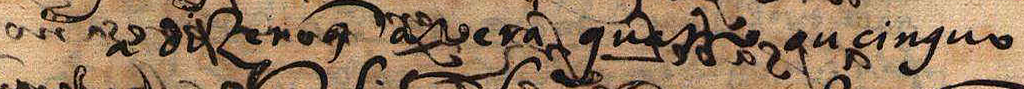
a dizer o q̄ avera quatro ou cinquo
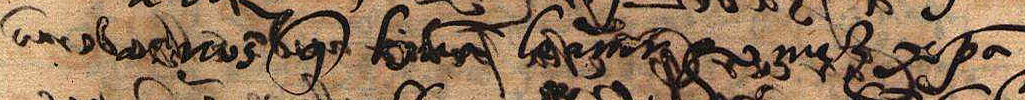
annos q̄ huā leanor gomez xpā
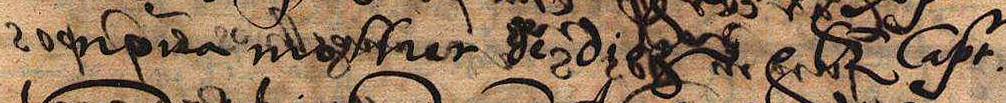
noua molher de diogo glz̄ capt.ro
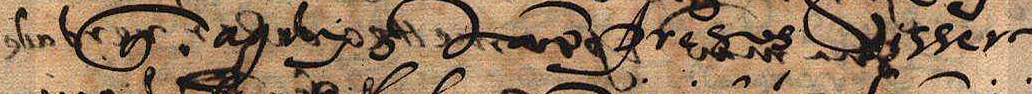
q̄ aquy staõ presos dissera
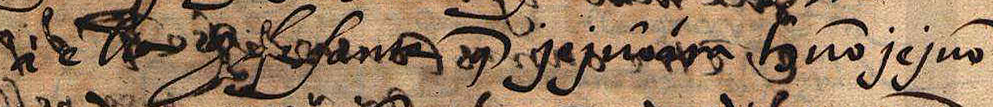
a elle ꝯfesante q̄ jejuōara huō jejuō
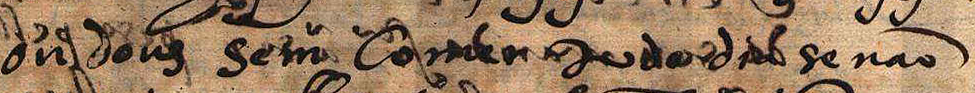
ou dous sem Comer todo dia senão
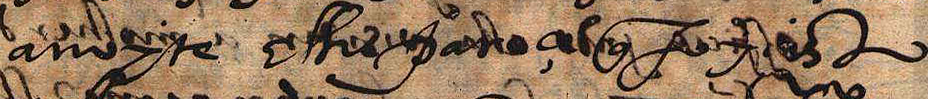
a noyte E lhe parece q̄ foy isto
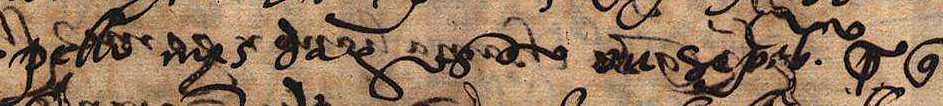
pello mes dagosto ou septb.ro p̄o q̄
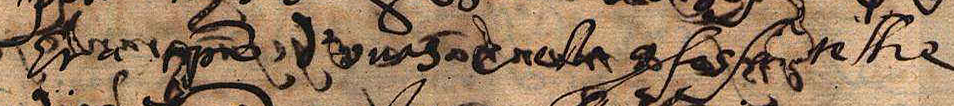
Era tpō do uaso e ella ꝯfessante lhe
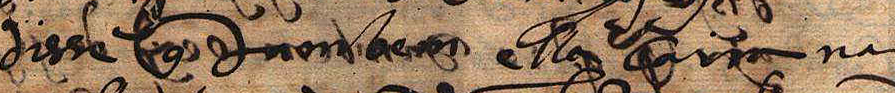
disse q̄ tambem elle caira na
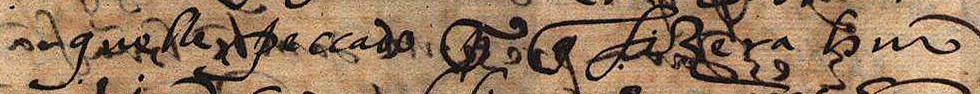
quelle peccado p̄o q̄ fazera huō
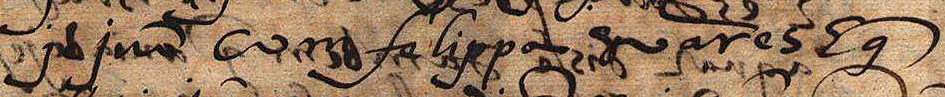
jejuō com felippa soares E q̄
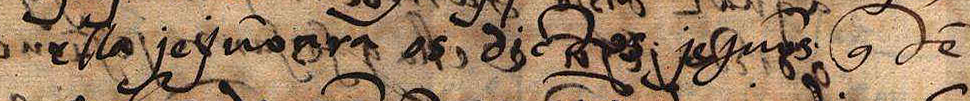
ella jejūoara os dictos jeJuōs q̄ tē
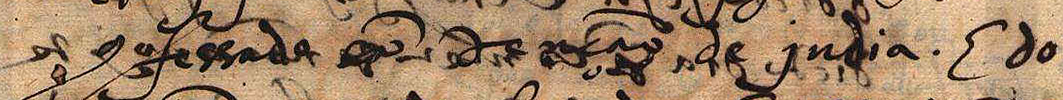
ꝯfessado cō tenção de judia. E do
